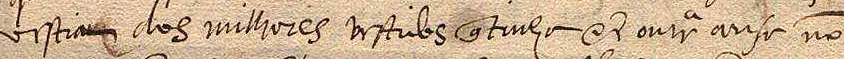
vestia dos milhores vestidos q̄ tinha e ē outra cousa n̄o
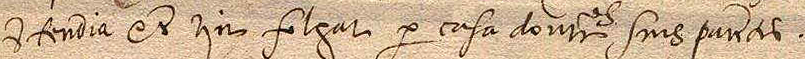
ētendia e ē hir folgar ꝑ casa doutros seus parētes.
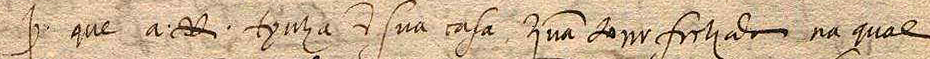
Pra. que a .R. tynha ē sua casa hūa torre fechada na qual
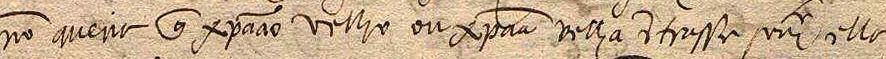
n̄o queria q̄ xpaão velho ou xpāa velha ētrasse somte ella
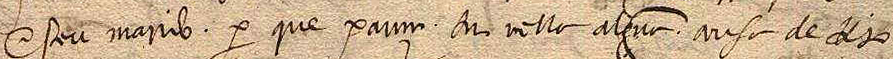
e seu marido . ꝑ que pareçe ter nella algūa. cousa de Rito
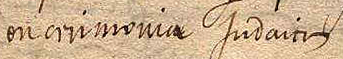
ou cerimonia Judaica
